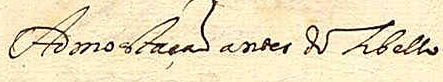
Admoestação antes do Libello
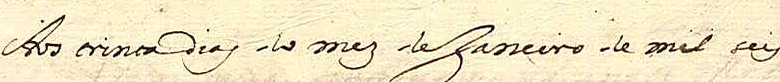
Aos trinta dias do mez de Janeiro de mil seis
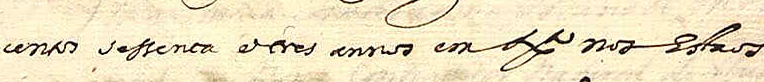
centos sessenta e tres annos em Lxa nos Estaos
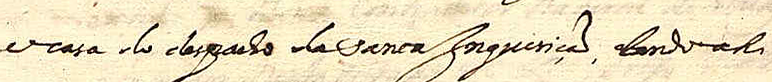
e casa do despacho da Santa Jnquisição, estando ahi
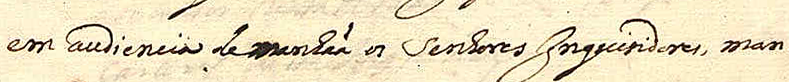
em audiencia de manhaā os Senhores Jnquisidores, man
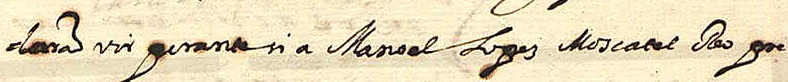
darão vir perante si a Manoel Lopez Moscatel Reo pre
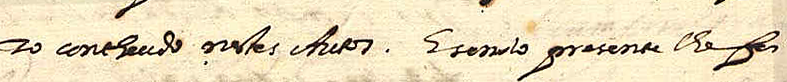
zo contheudo nestes Autos. E sendo presente lhe foi
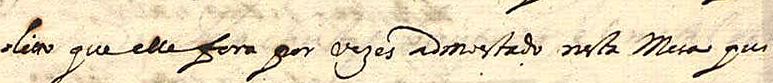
ditto que elle fora por vezes admoestado nesta Mesa qui
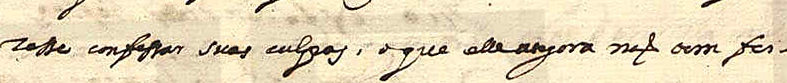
zesse confessar suas culpas, o que elle ate gora naõ tem fei
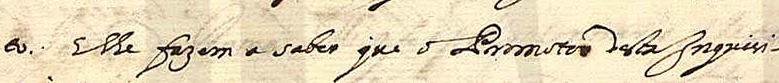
to. E lhe fazem a saber que o Promotor desta Jnqui
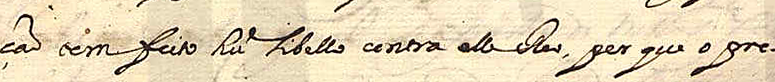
ção tem feito hū Libello contra elle Reo, per que o pre
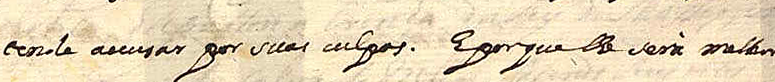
tende accusar por suas culpas. E porque lhe serà melhor
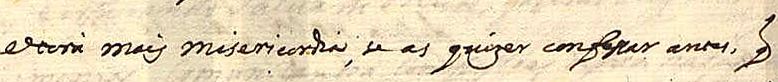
e terà mais misericordia, se as quizer confessar antes, q̄
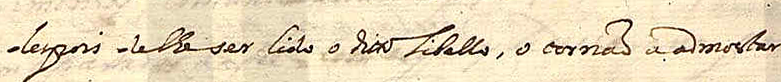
despois de lhe ser lido o dito Libello, o tornão a admoestar
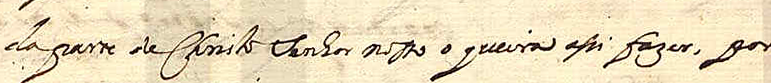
da parte de Christo Senhor nosso o queira assi fazer, por
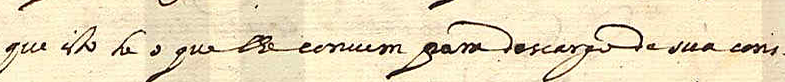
que isto he o que lhe conuem para descargo de sua cons
